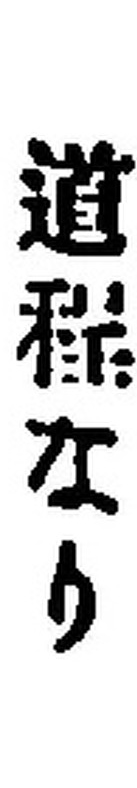道程なり
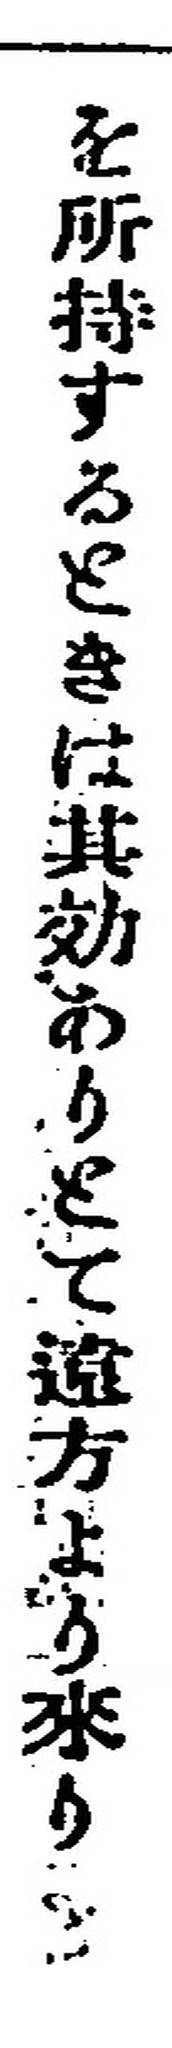を所持するときは其効ありとて遠方より来り
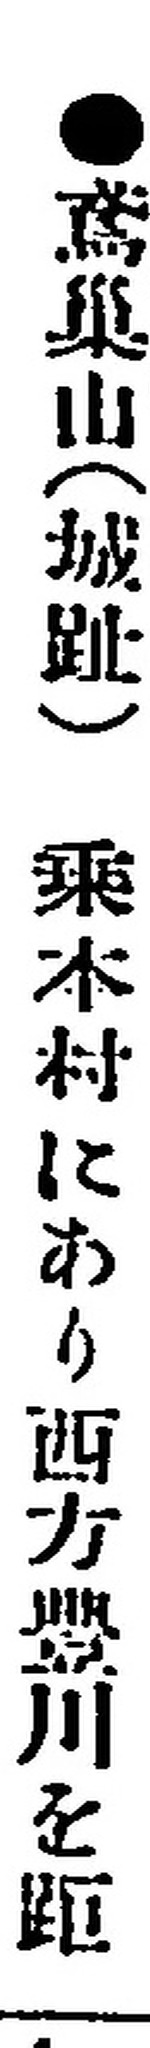●鳶巣山(城趾)乗本村にあり西方豊川を距
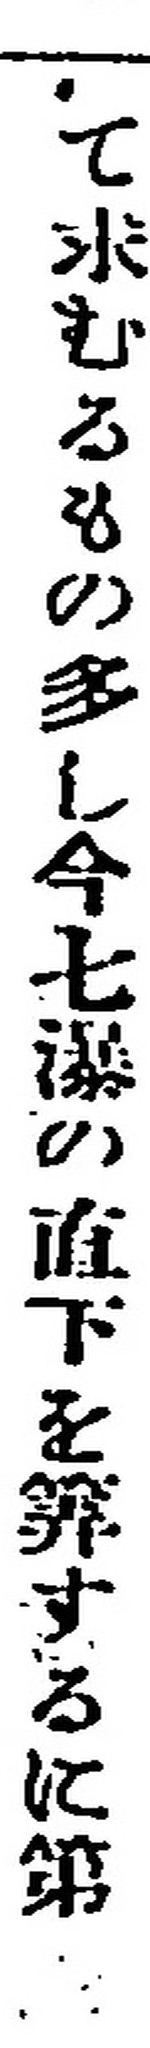て求むるもの多し今七瀑の直下を筭するに第
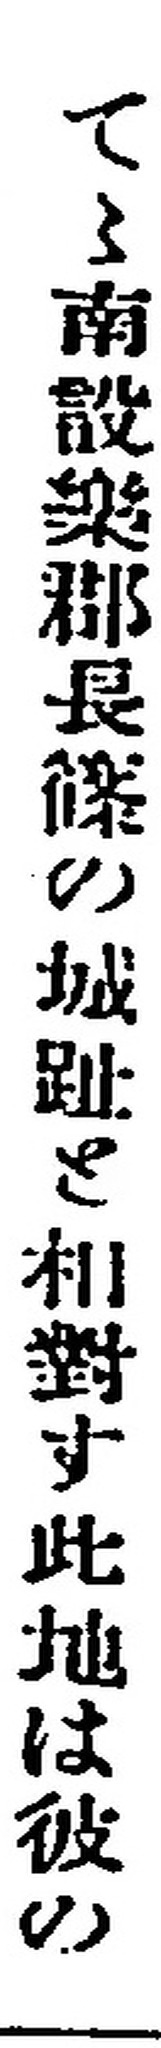てゝ南設楽郡長篠の城趾と相対す此地は彼の
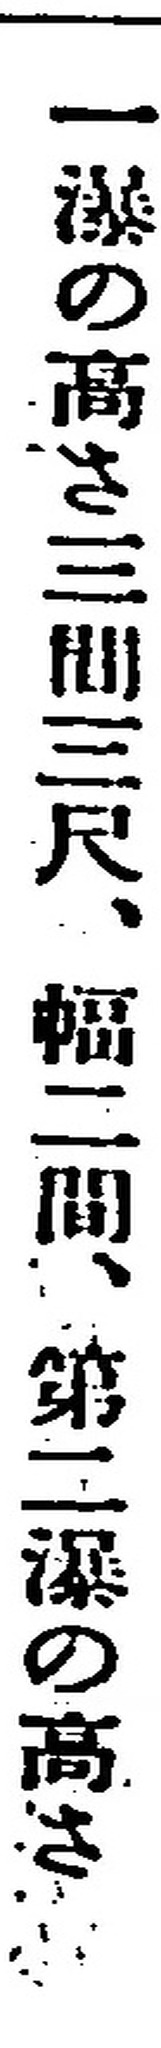一瀑の高さ三間三尺、幅二間、第二瀑の高さ
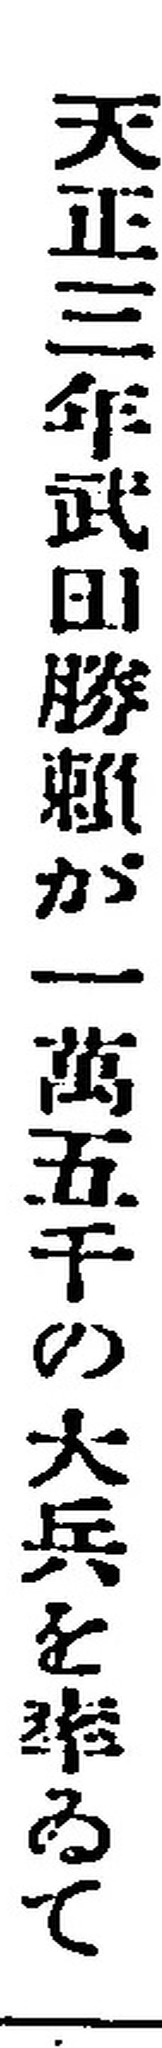天正三年武田勝頼が一万五千の大兵を率ゐて
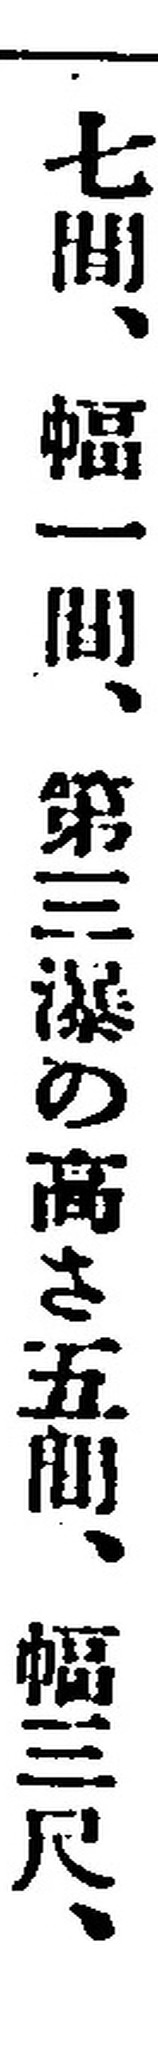七間、幅一間、第三瀑の高さ五間、幅三尺、
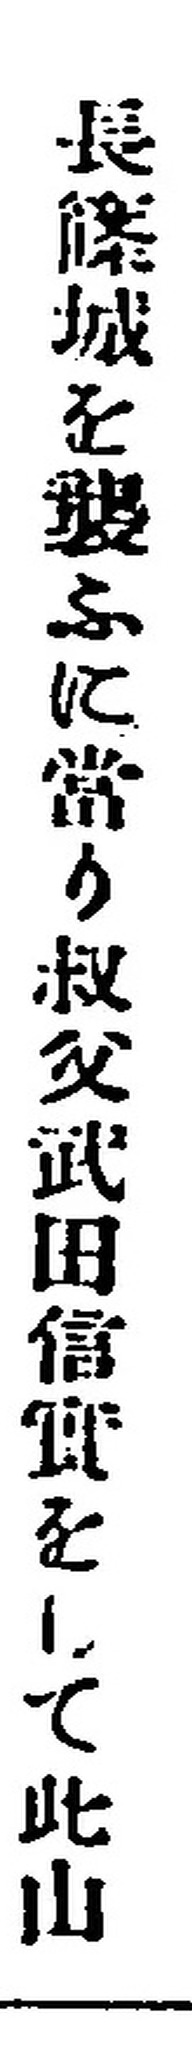長篠城を襲ふに当り叔父武田信実をして此山
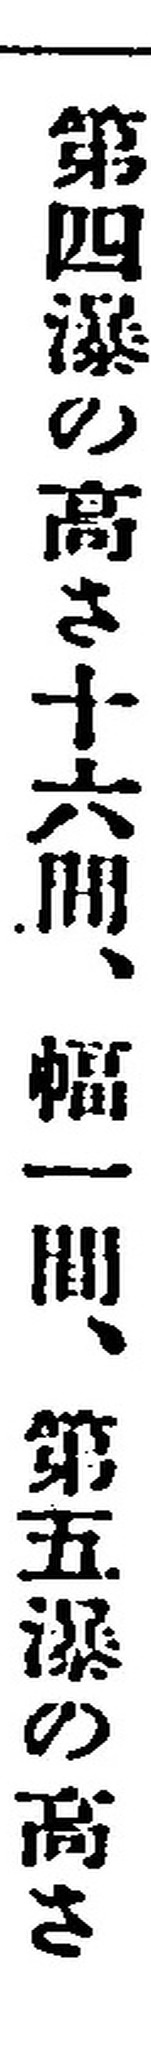第四瀑の高さ十六間、幅一間、第五瀑の高さ
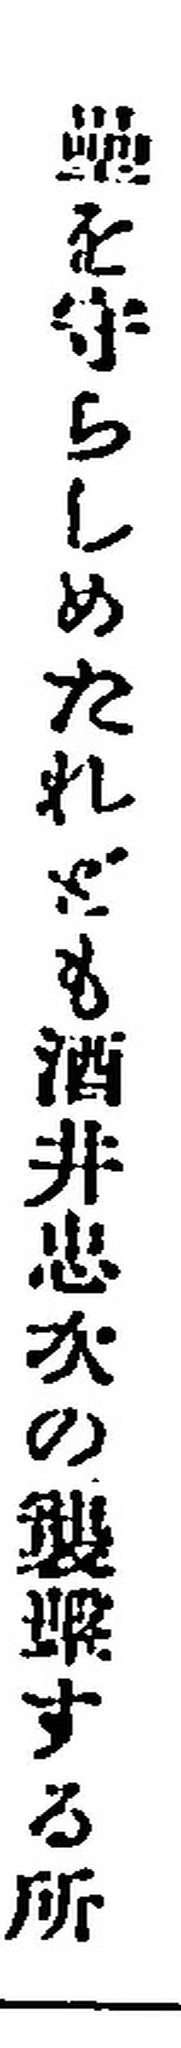塁を守らしめたれども酒井忠次の襲撃する所
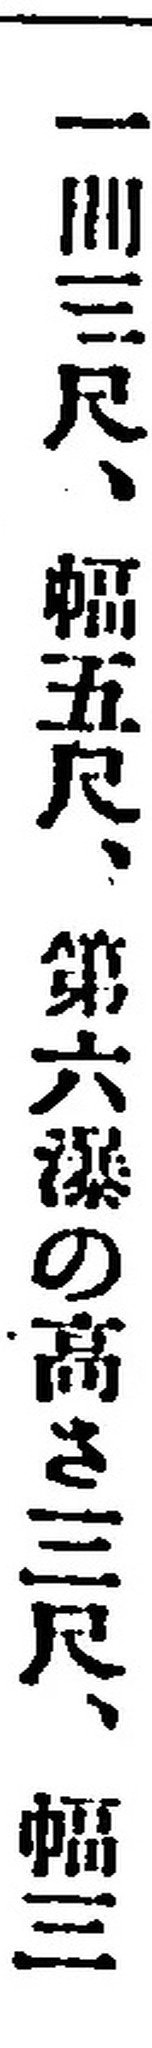一間三尺、幅五尺、第六瀑の高さ三尺、幅三
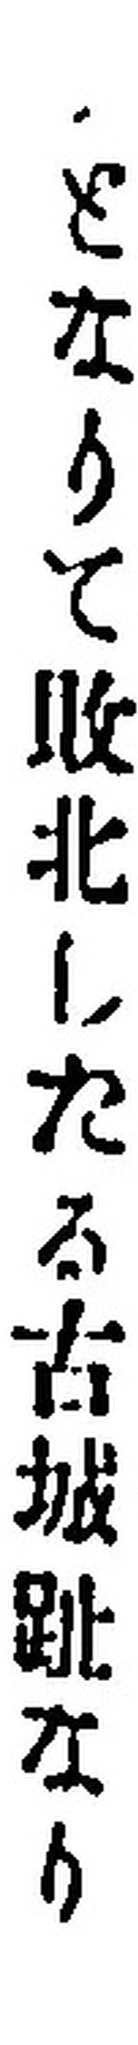となりて敗北したる古城趾なり
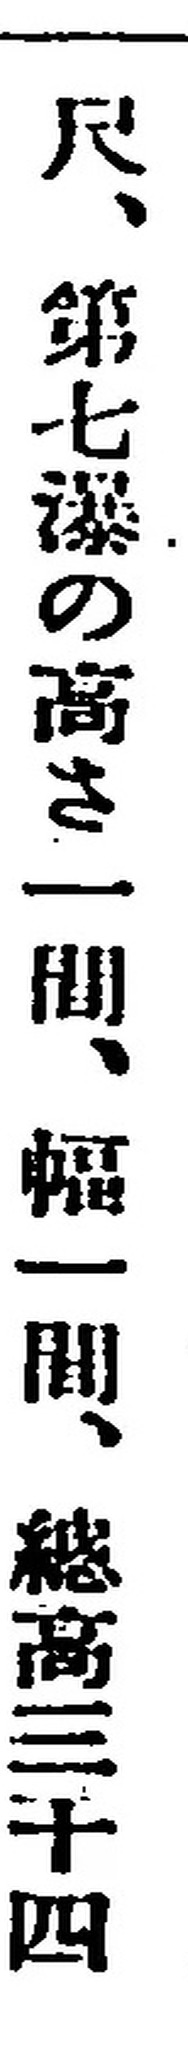尺、第七瀑の高さ一間、幅一間、総高三十四
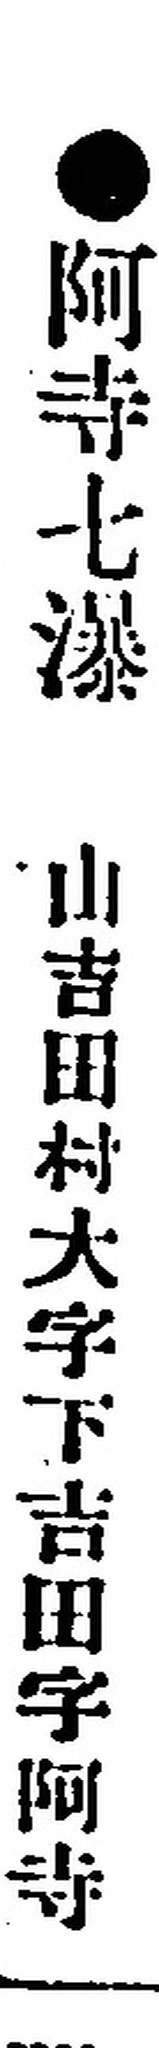●阿寺七瀑山吉田村大字下吉田字阿寺
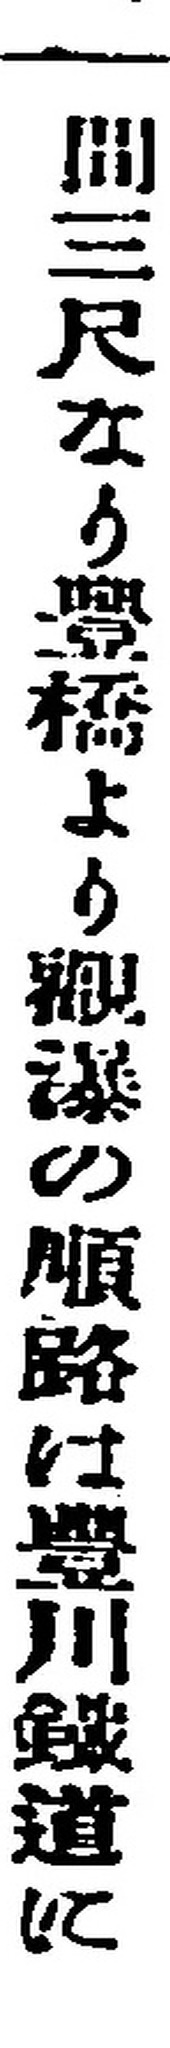間三尺なり豊橋より観瀑の順路は豊川鉄道に
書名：東参名勝案内
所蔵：国立国会図書館 National Diet Library, JAPAN
